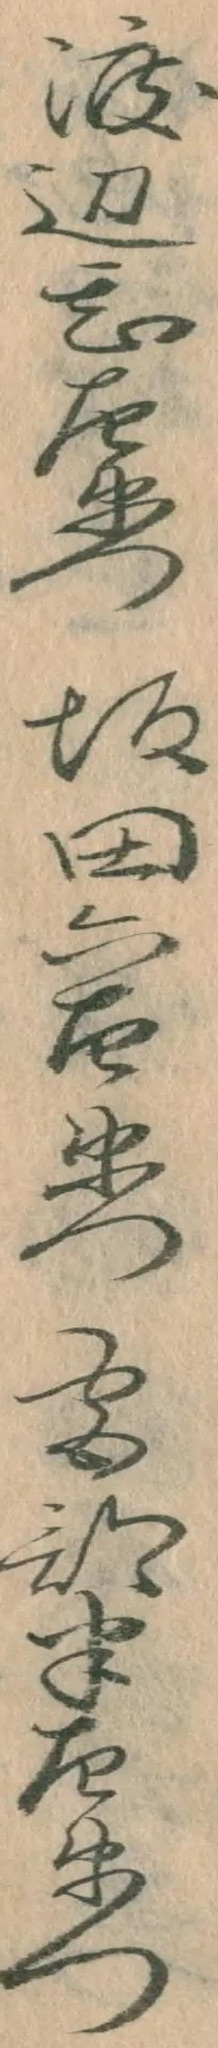渡辺甚左衛門坂田六左衛門宮部半左衛門
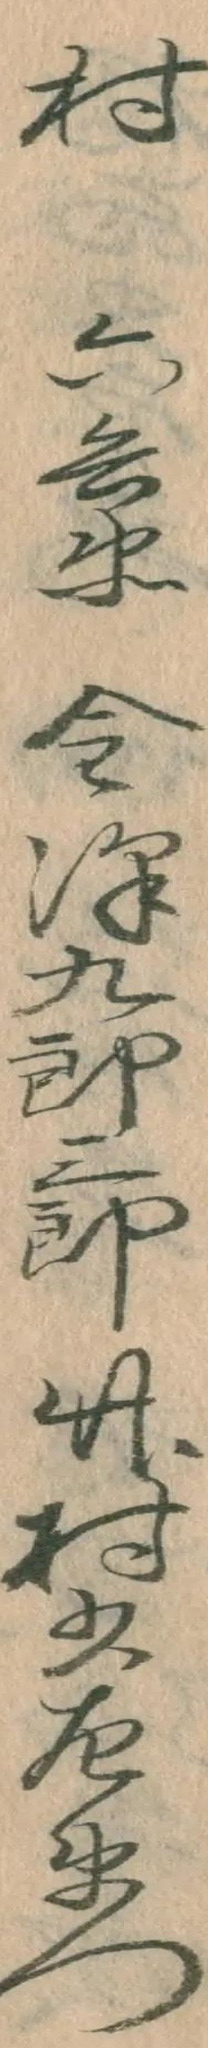村六兵衛金沢九郎三郎竹村少左衛門
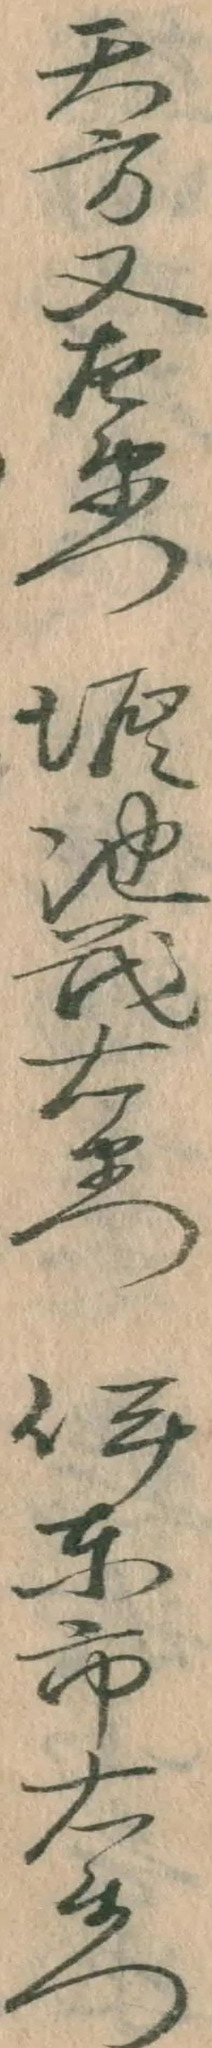天方又左衛門堀池茂右衛門伊東市右衛門
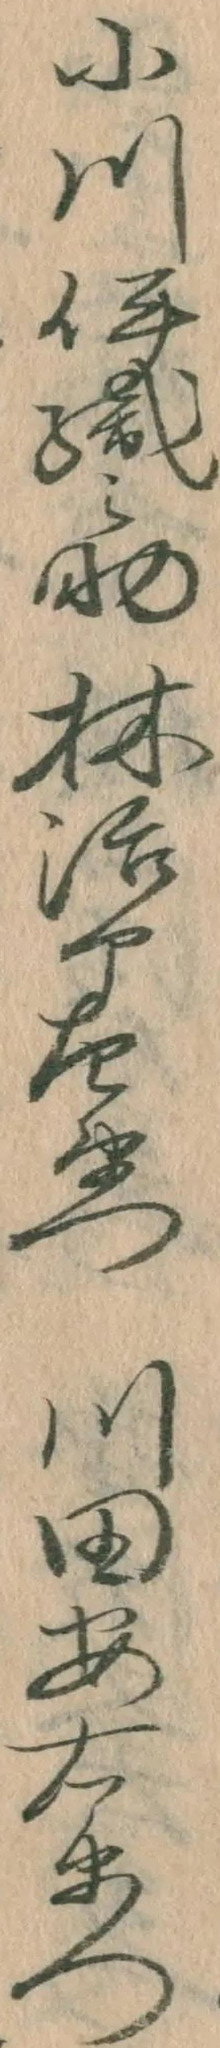小川伊織之助林治部左衛門川田安右衛門
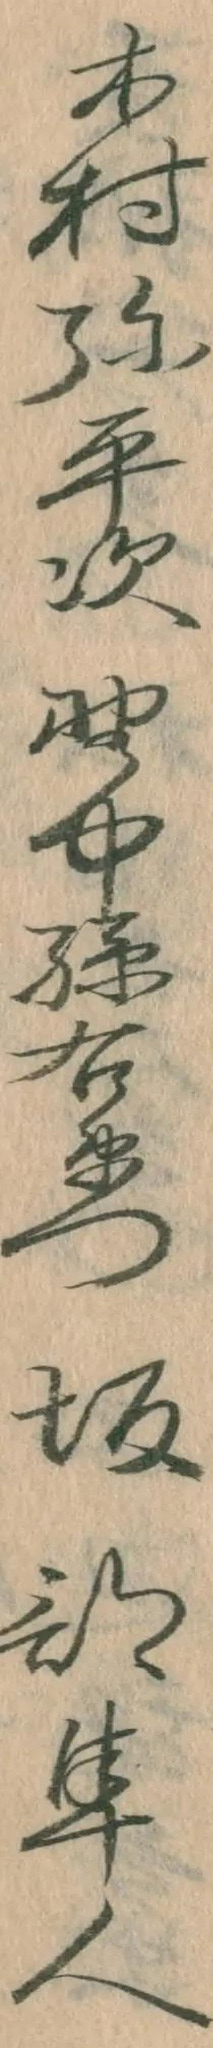木村弥平次野中孫右衛門坂部隼人
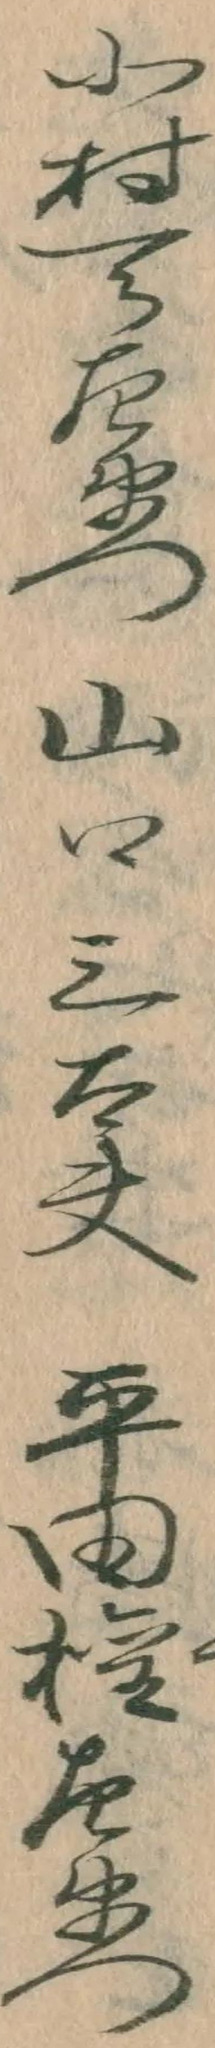北村一郎左衛門山口三太夫平田権右衛門
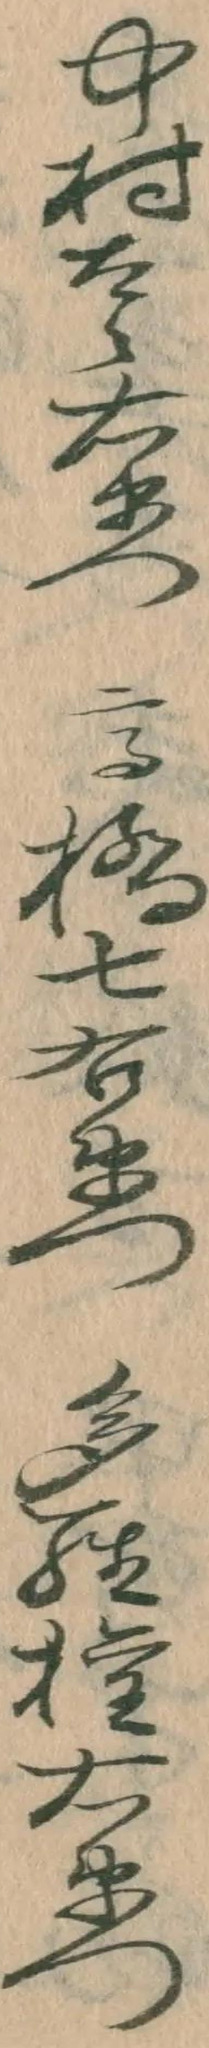中村太郎右衛門高橋七右衛門多羅権右衛門
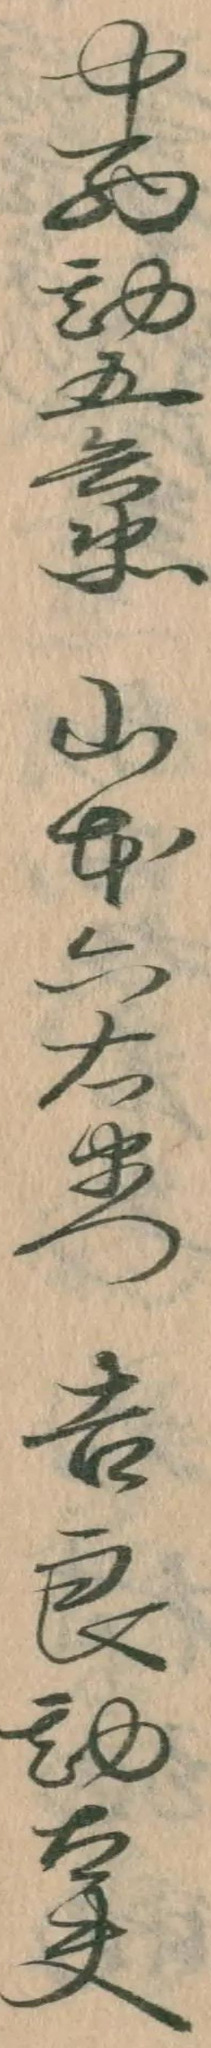中西勘五兵衛山本六右衛門吉良勘太夫
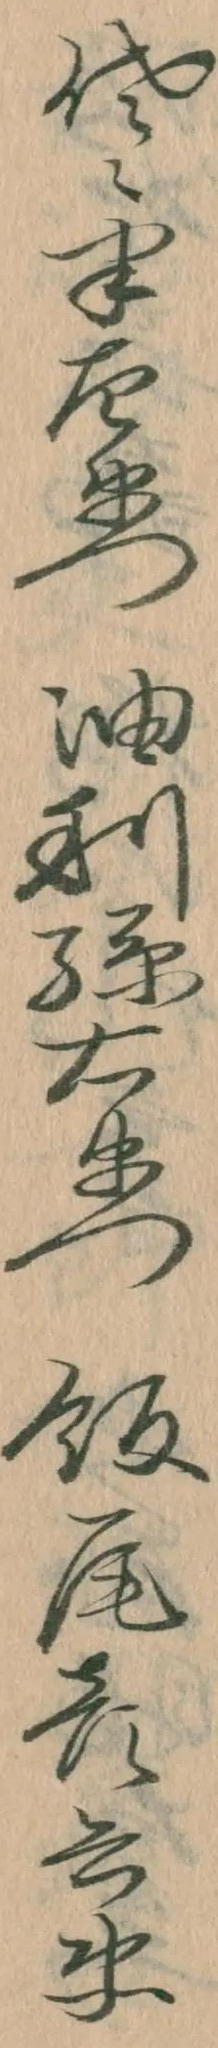佐々半左衛門由利孫右衛門飯尾彦兵衛
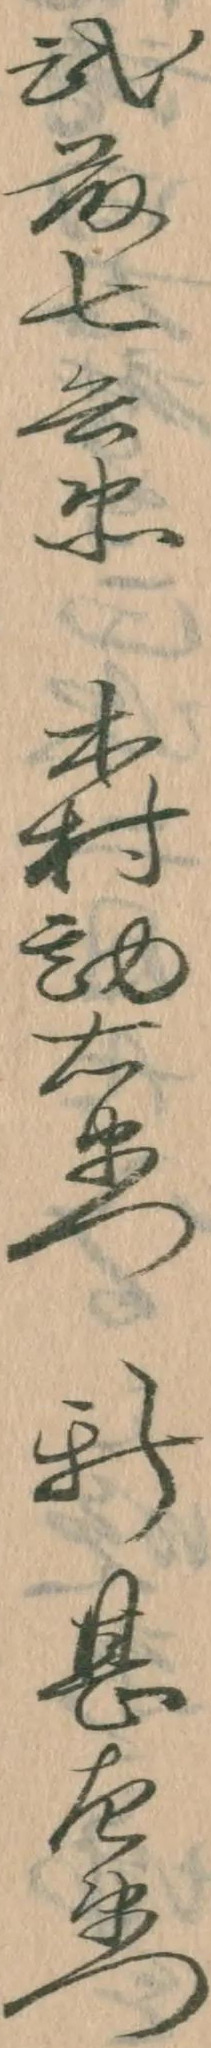武藤七兵衛木村勘右衛門新甚左衛門
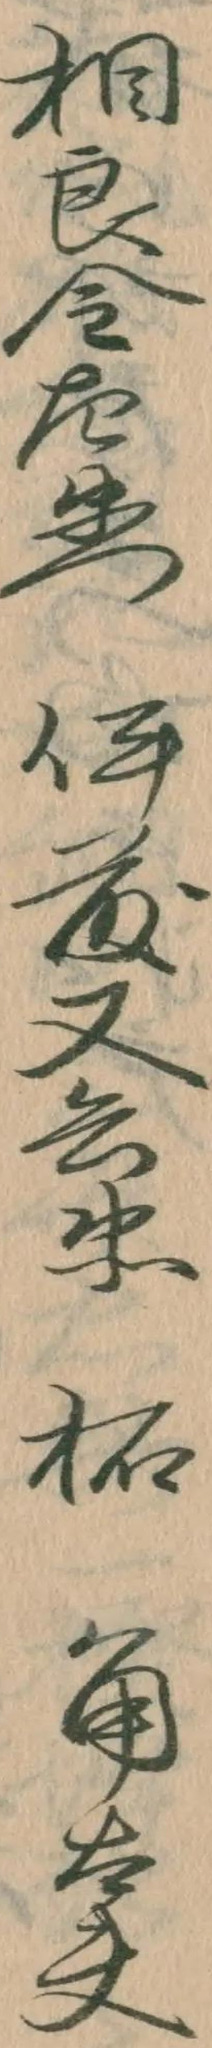相良金左衛門伊藤又兵衛柘角太夫
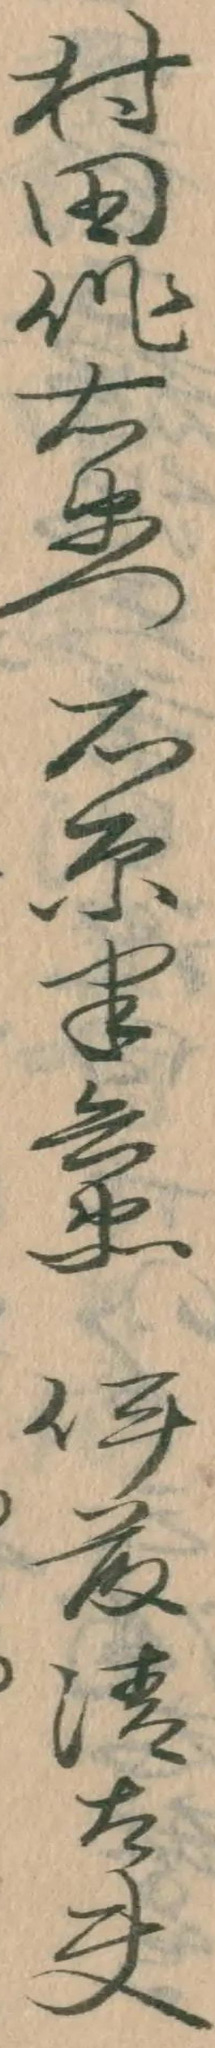村田作右衛門石原半兵衛伊藤清太夫
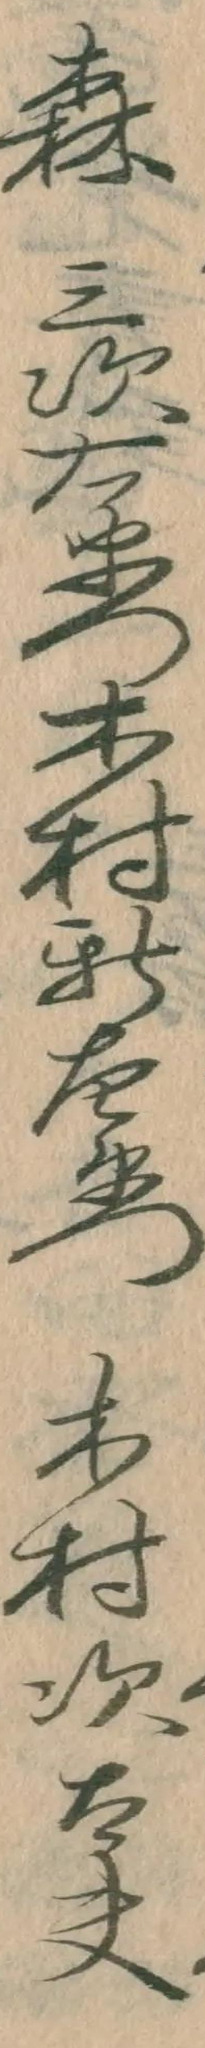森三次右衛門木村新左衛門木村次太夫
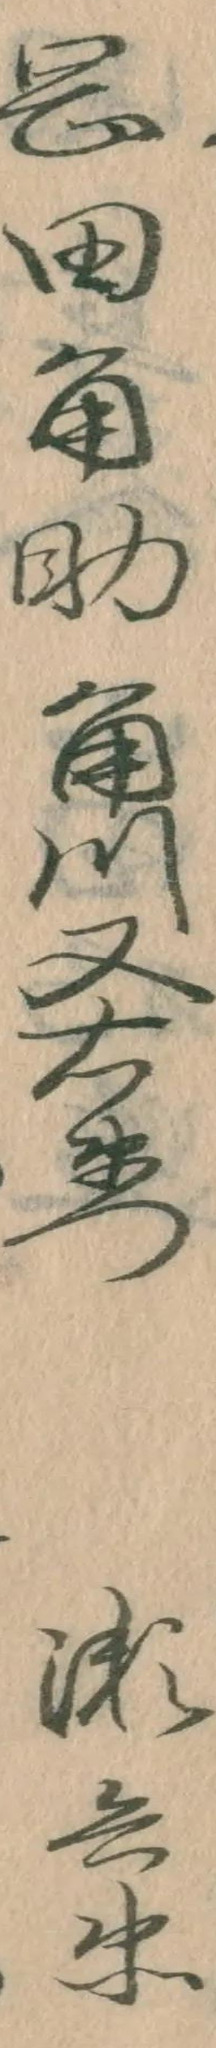岡田角助角川又右衛門瀬兵衛
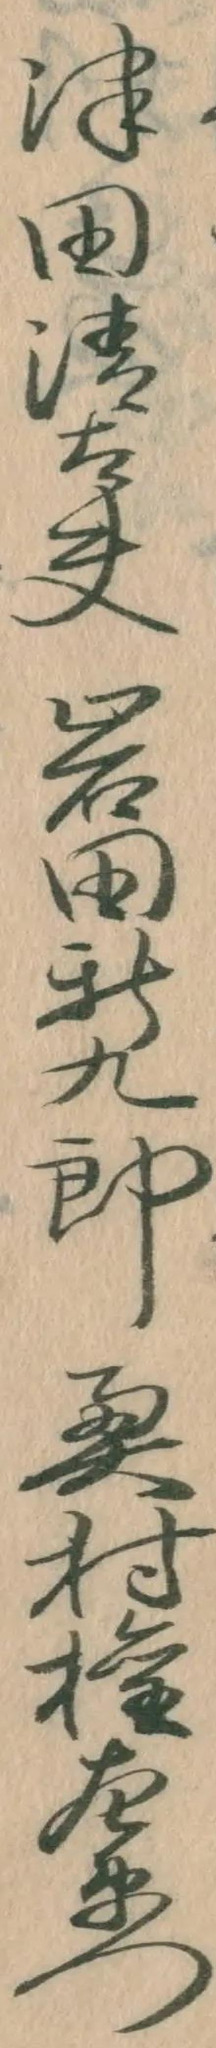津田清太夫岩田新九郎奥村権左衛門
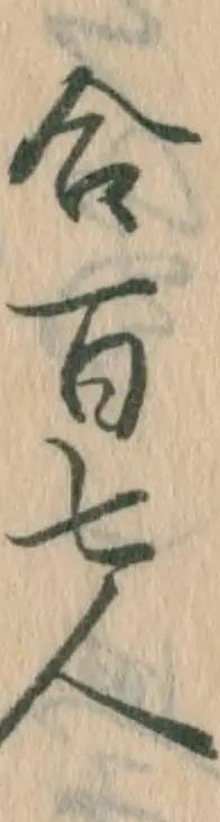合百七人
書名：切支丹御退治記 49巻. [9]
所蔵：国立国会図書館 National Diet Library, JAPAN
